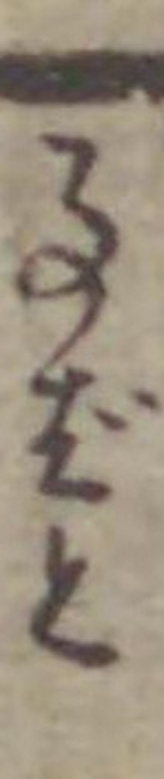事ばと
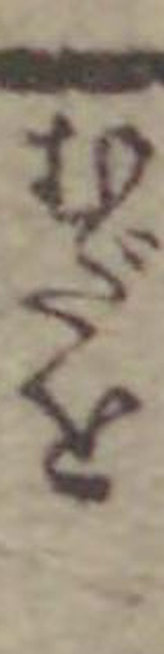むだを
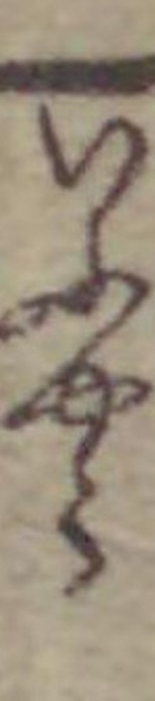いふやら
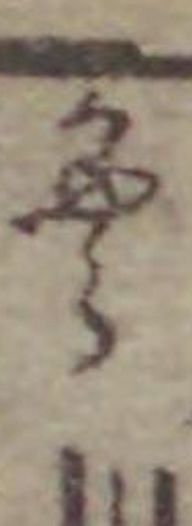かやら
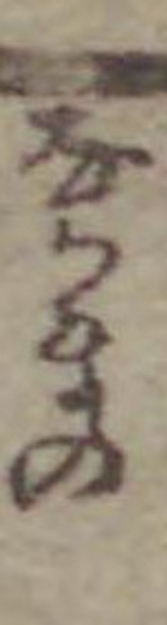なかまの
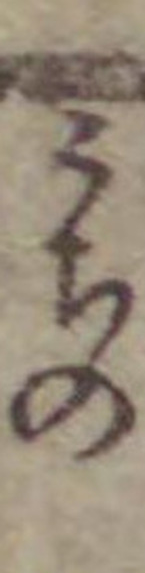うちの
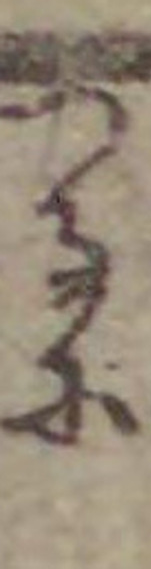つるに
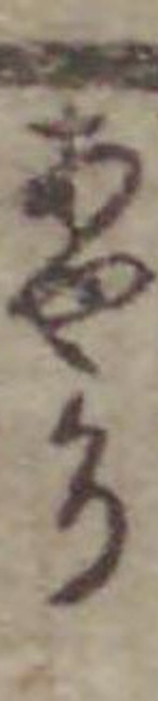あやかり
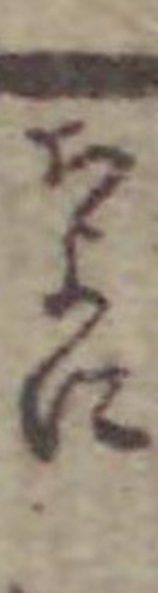ちよに
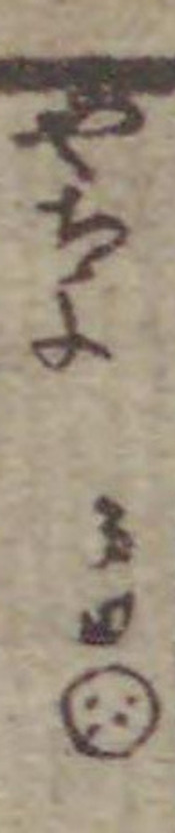やちよ
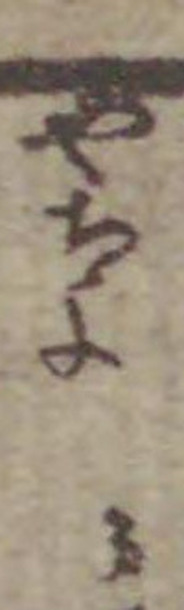やちよ
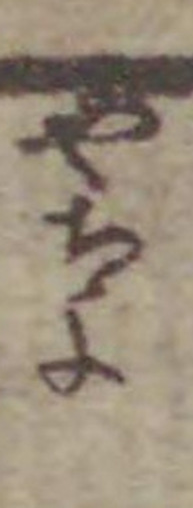やちよ
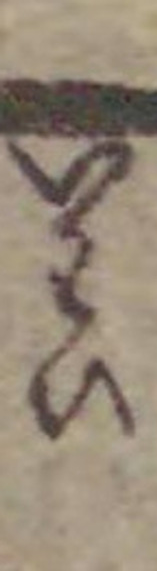いわい

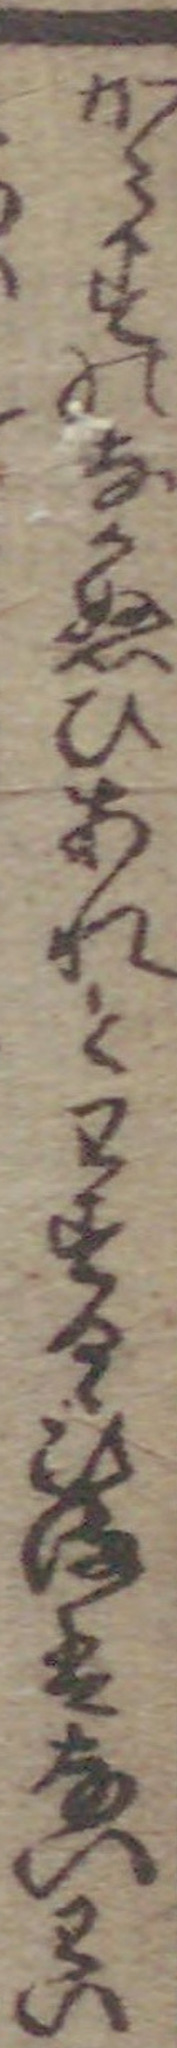からすのなかぬひあれとわするゝひまはないわいのとハ
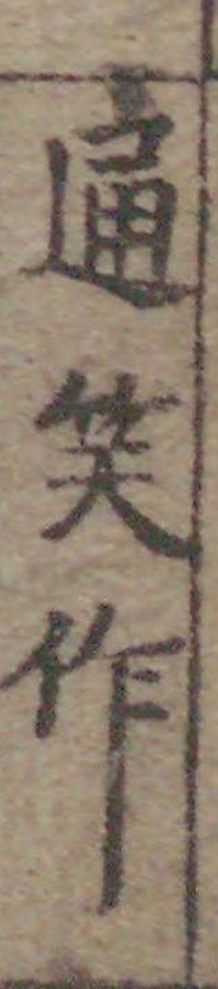通笑作
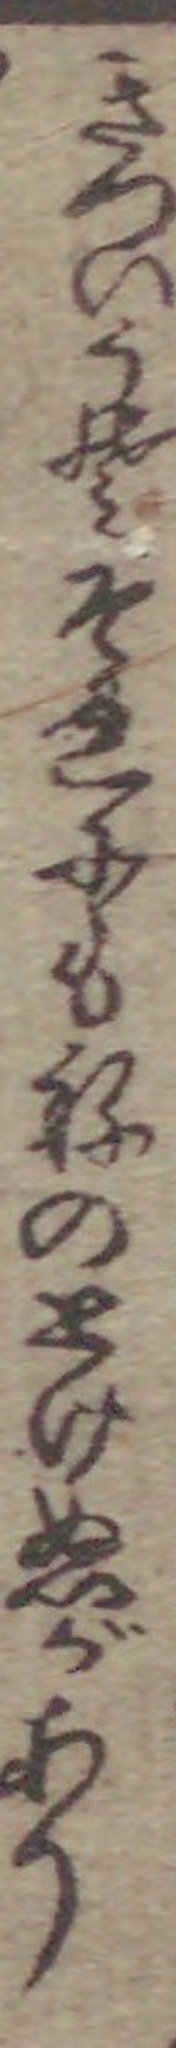きついうそそれにもねのとけぬがあり
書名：烏行水諺草 3巻
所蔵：国立国会図書館 National Diet Library, JAPAN
